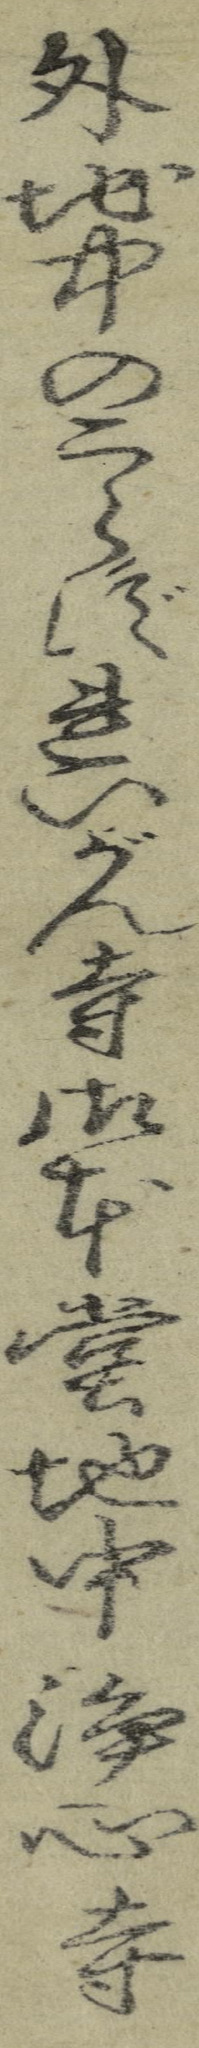外地中のこらずれいがん寺御本堂地中淨心寺
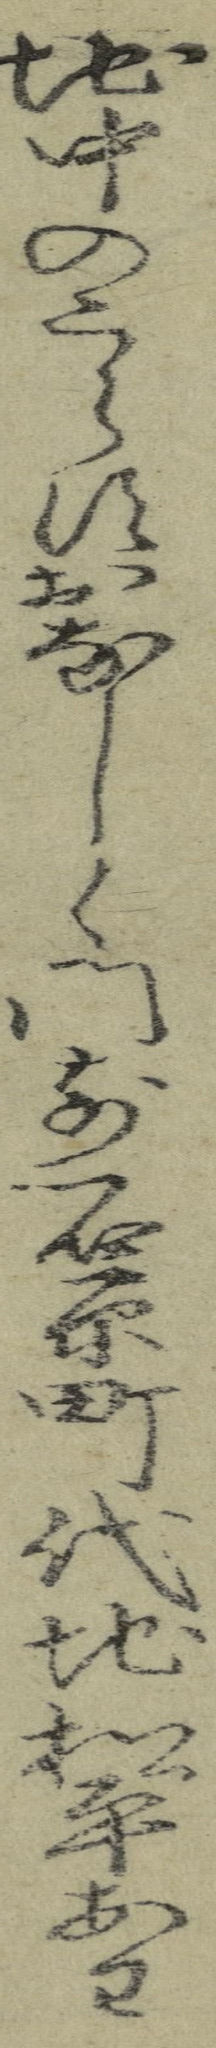地中にこらすおなしく門前石原町代地松平あわ
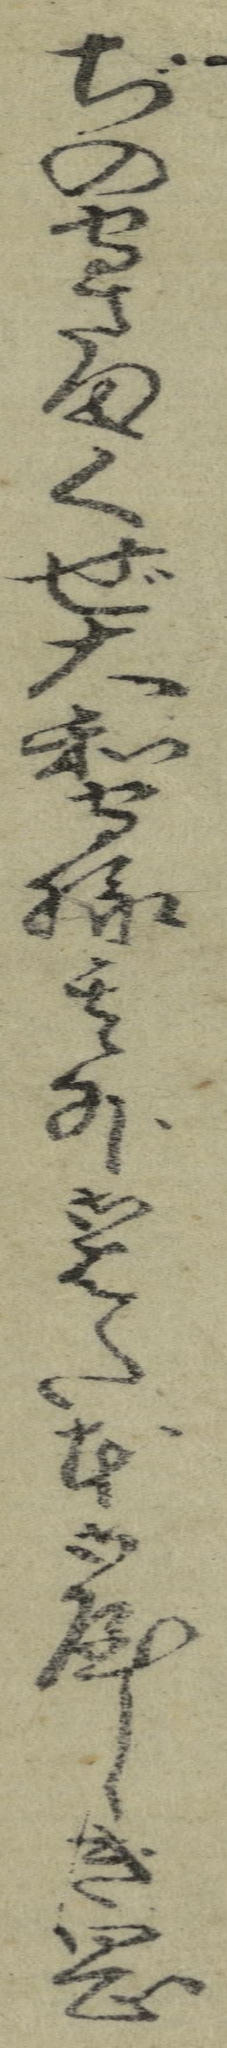ぢの守さまくぜ大和守様其外御はた本御やしき岡
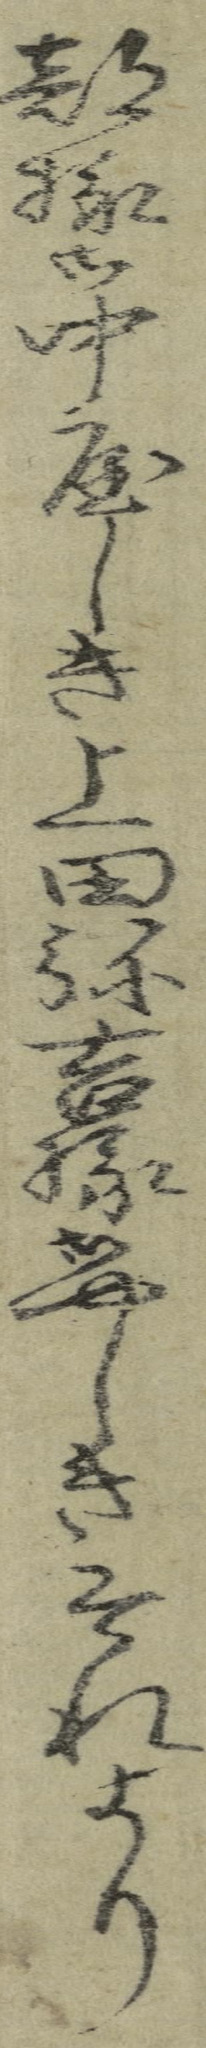部様御中やしき上田弥吉様御やしきそれより
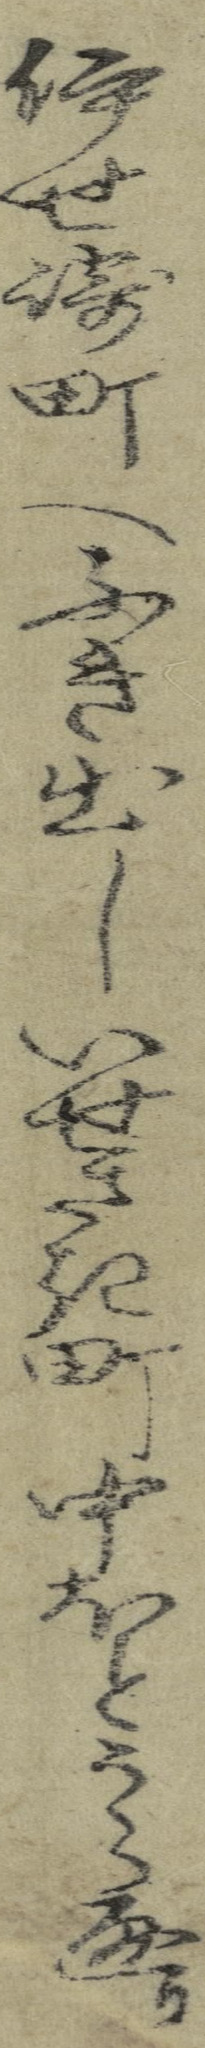伊せ崎町へふき出しいせさき町中ほとうら通り
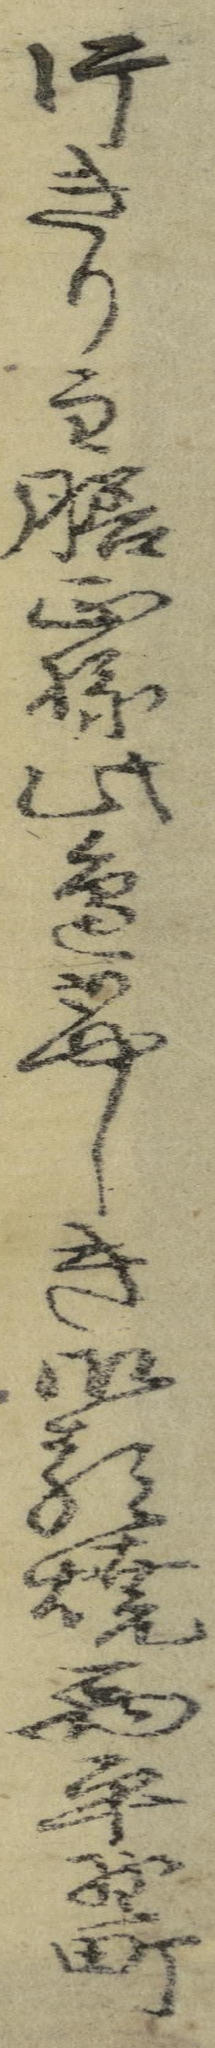片きり主膳正様此辺御やしき御類焼西平野町
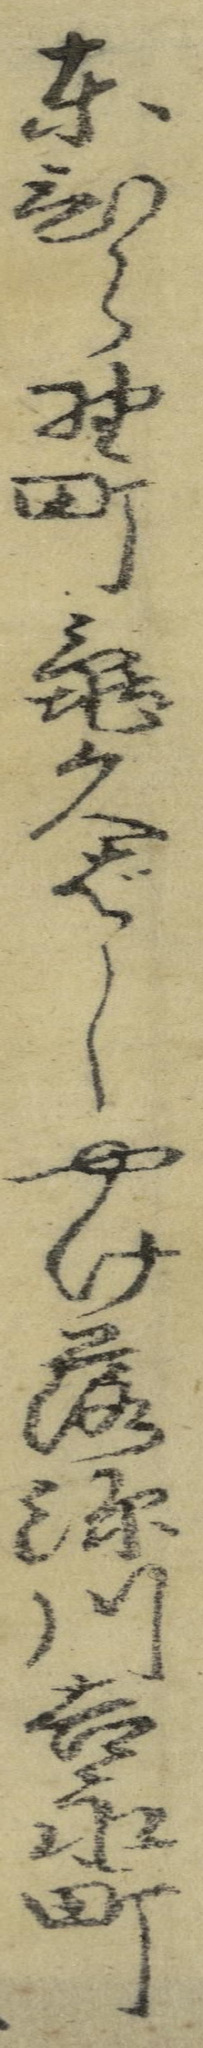東ひら野町亀久ばしやけ落深川吉永町
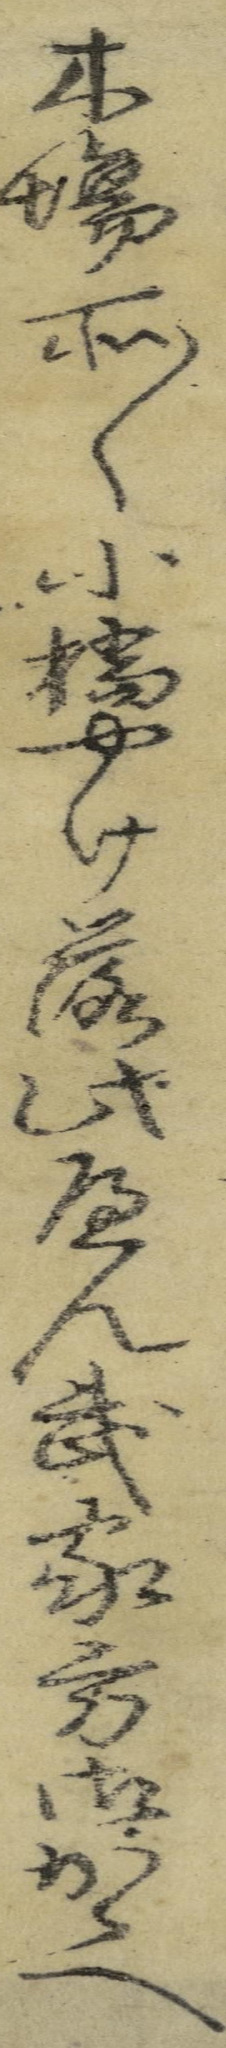木場所々小橋やけ落此へん武家方御かゝへ
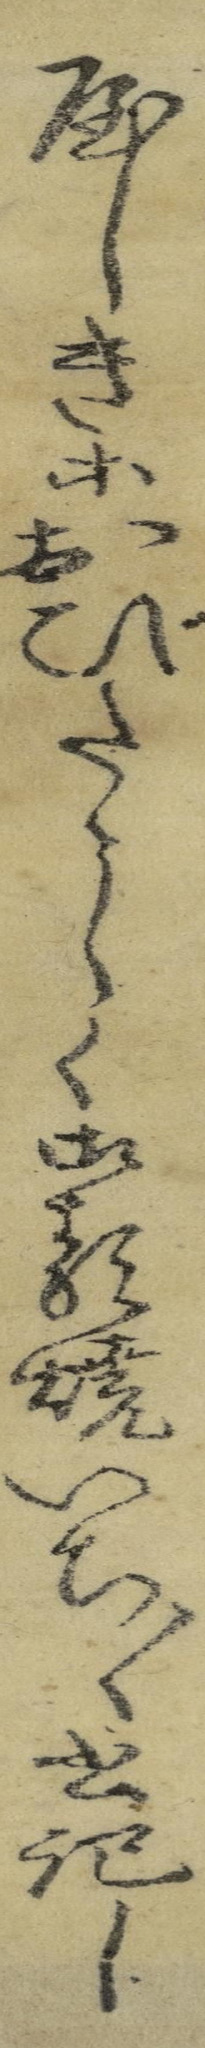やしき等おびたゝしく御類焼いち〳〵書記し
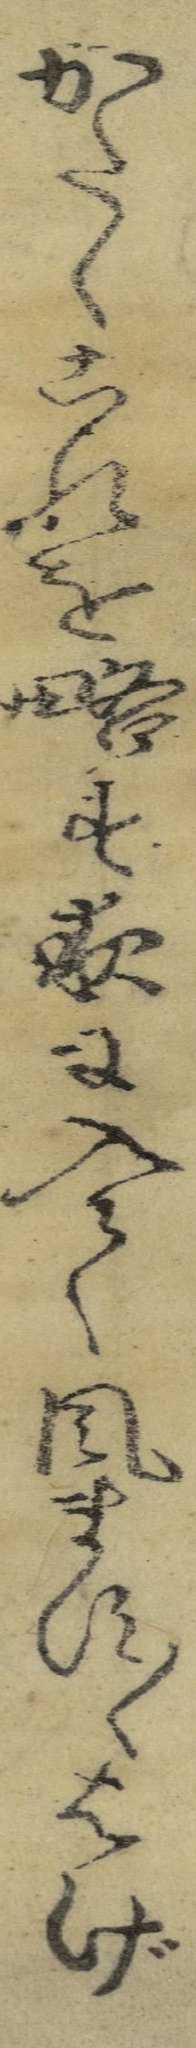かたくこれを略す夜に入て風ます〳〵はげ
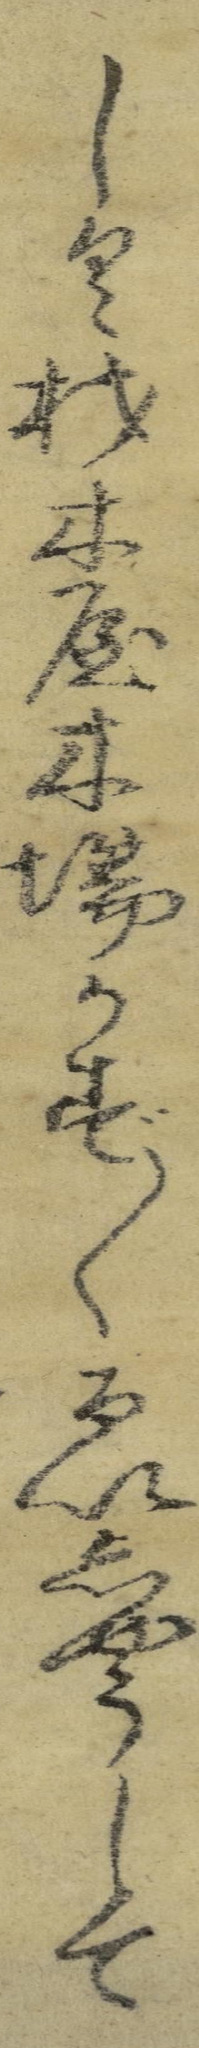しく材木屋木場かず〳〵るいしやうして
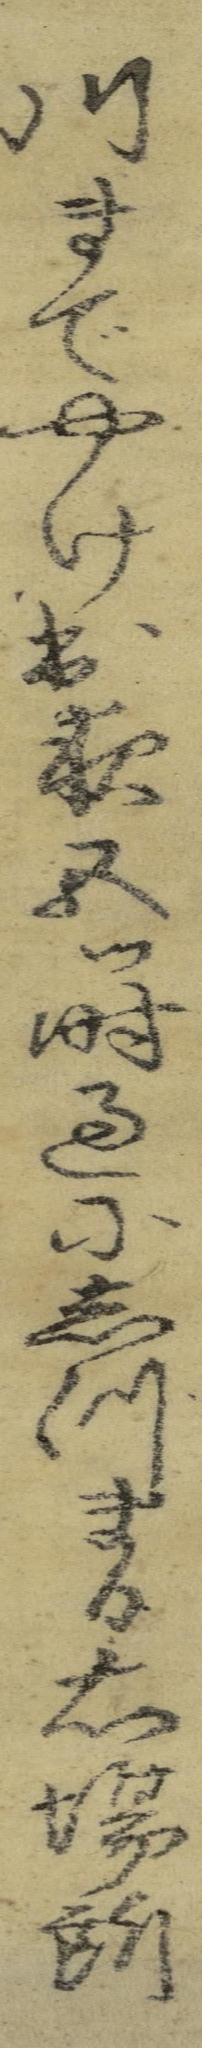川までやけ出夜五ッ時過にしずまる右場所
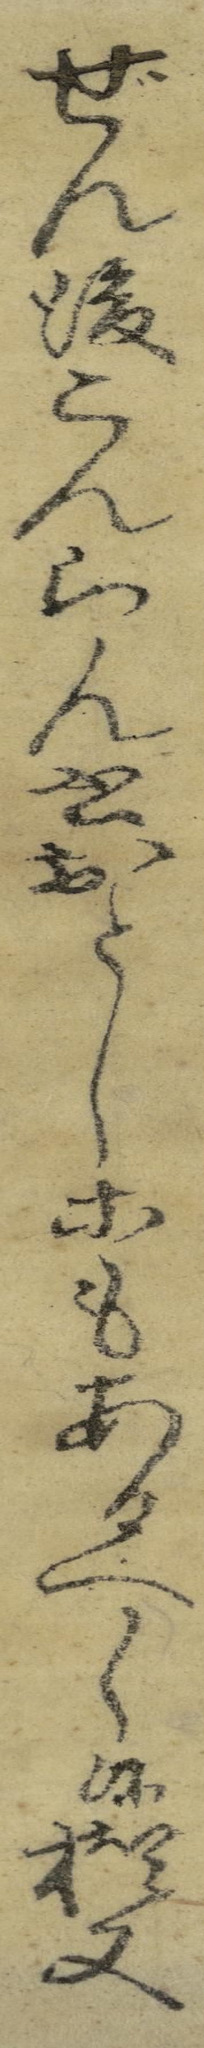ぜん後こんらん書おとし等もあるへく候猶又
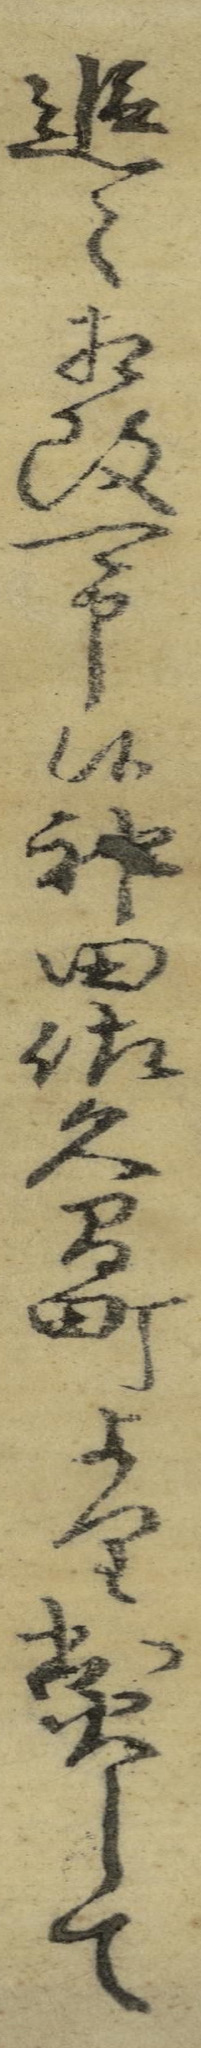追々相改可申候神田佐久間町より出火して
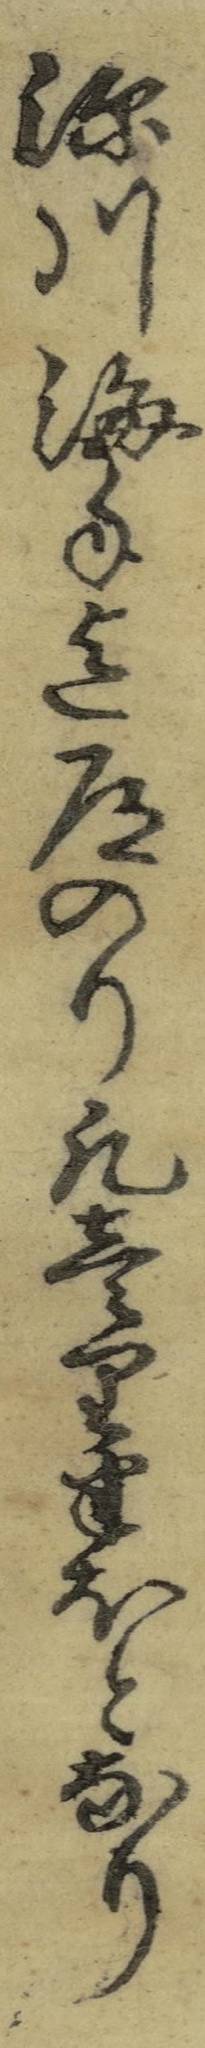深川海手迄道のり凡壱里半ほとなり
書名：出火場道しらべ
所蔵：東京大学地震研究所図書室 Earthquake Research Institute Library, The University of Tokyo, JAPAN
